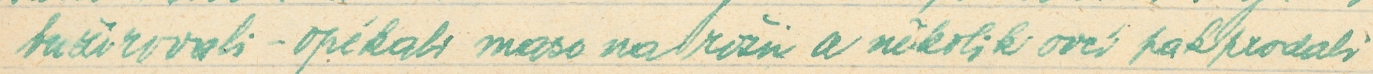bažirovali - opékali maso na rožni a několik ovcí pak prodali
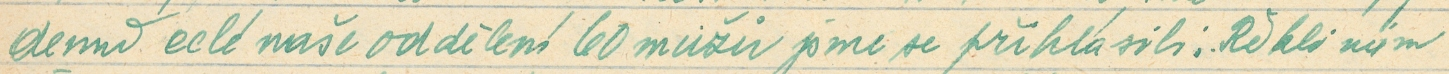denně celé naše oddělení 60 mužů jsme se přihlásili. Řekli nám
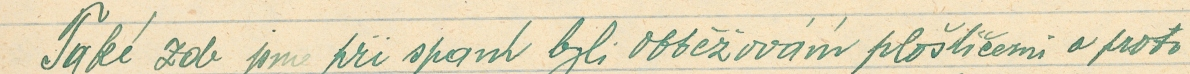Také zde jsme při spaní byli obtěžování ploštičemi a proti
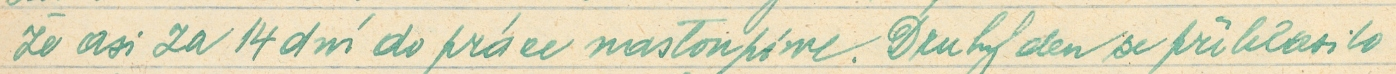že asi za 14 dní do práce nastoupíme. Druhý den se přihlasilo
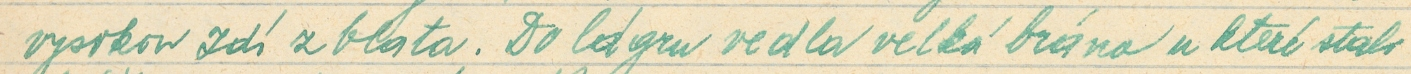vysokou zdí z blata. Do lágru vedla velká brána u které stalo
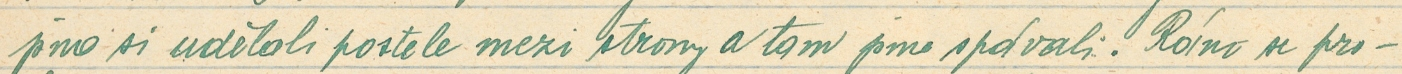jsme si udělali postele mezi stromy a tam jsme spávali. Ráno se pro-
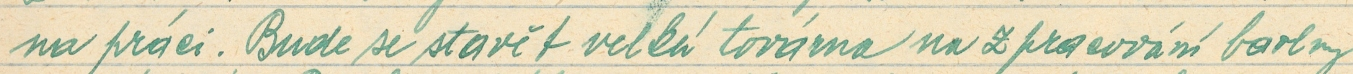na práci. Bude se stavět velká továrna na zpracování bavlny
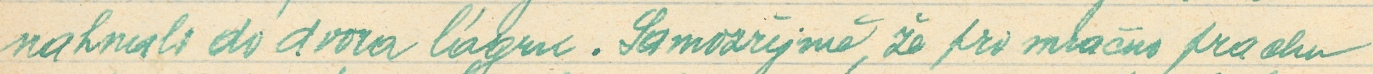nahnali do dvora lágru. Samozřejmě, že pro mračno prachu
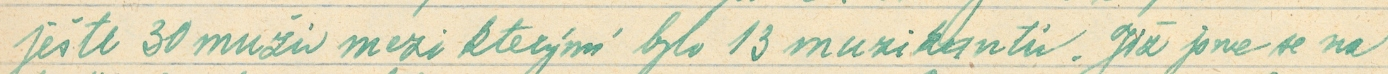ješte 30 mužů mezi kterými bylo 13 muzikantů. Již jsme se na
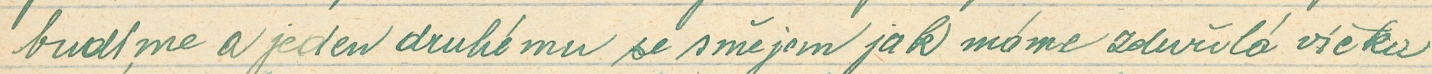budíme a jeden druhému se smějem jak máme zduřelá víčka
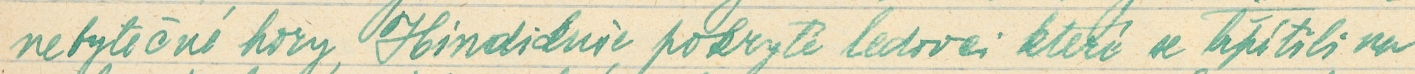nebytečné hory Hindikuše pokryté ledovci které se třpítili na
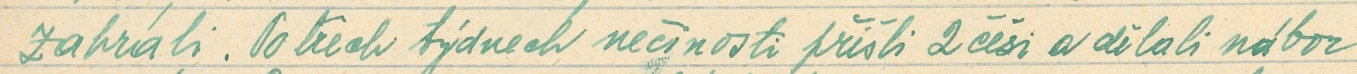zahráli. Po třech týdnech nečinosti přišli 2 češi a dělali nábor
